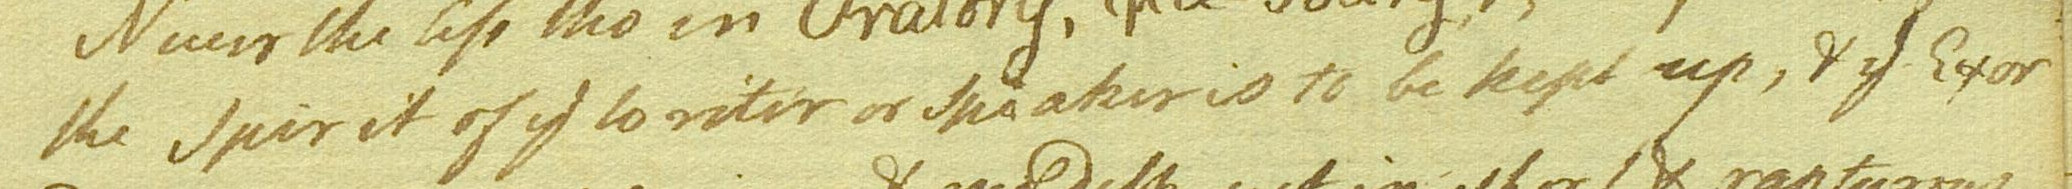the Spirit of y^e Writer or Speaker is to be kept up, & y^e Exor
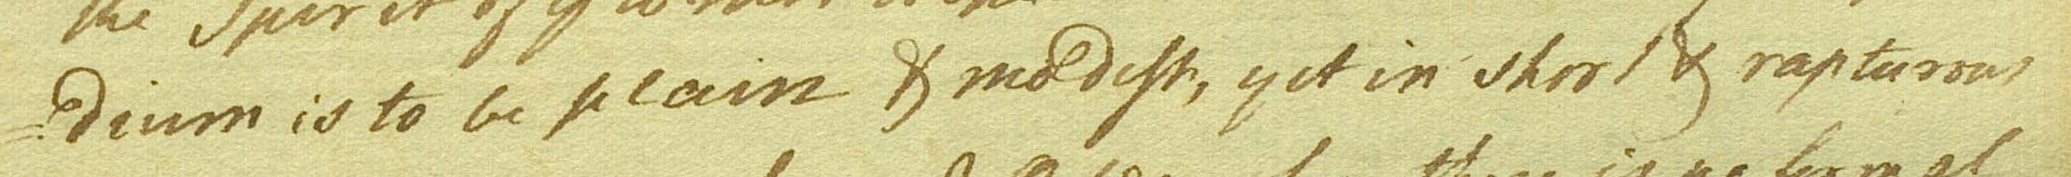-dium is to be plain & modest, yet in short & rapturous
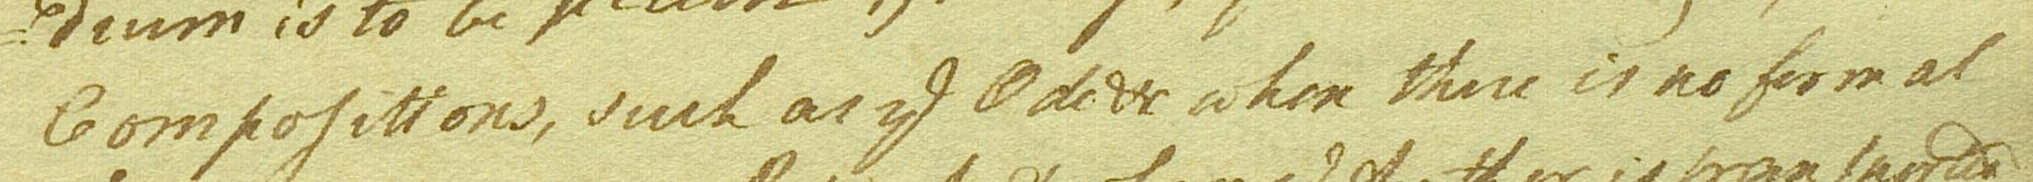Compositions, such as y^e Ode &c when there is no formal
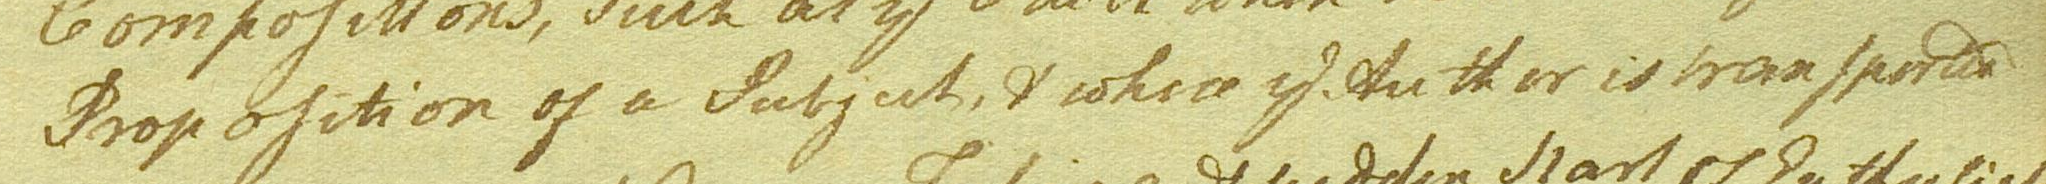Proposition of a Subject, & where y^e Author is transported
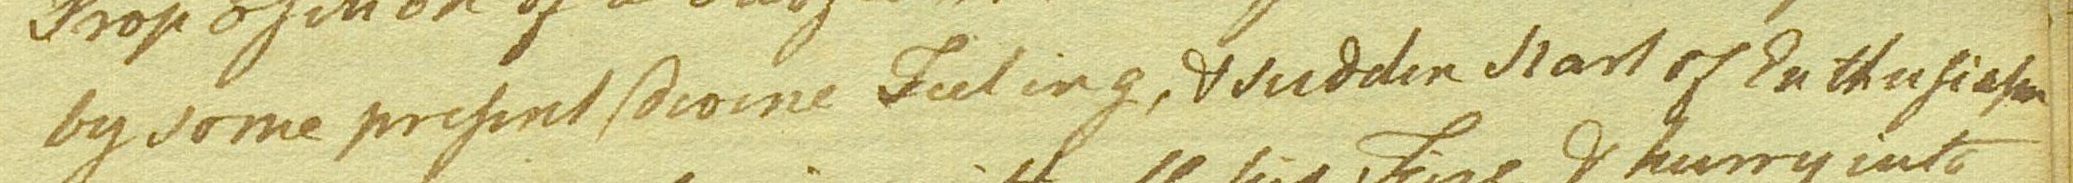by some present divine Feeling, & sudden Start of Enthusiasm
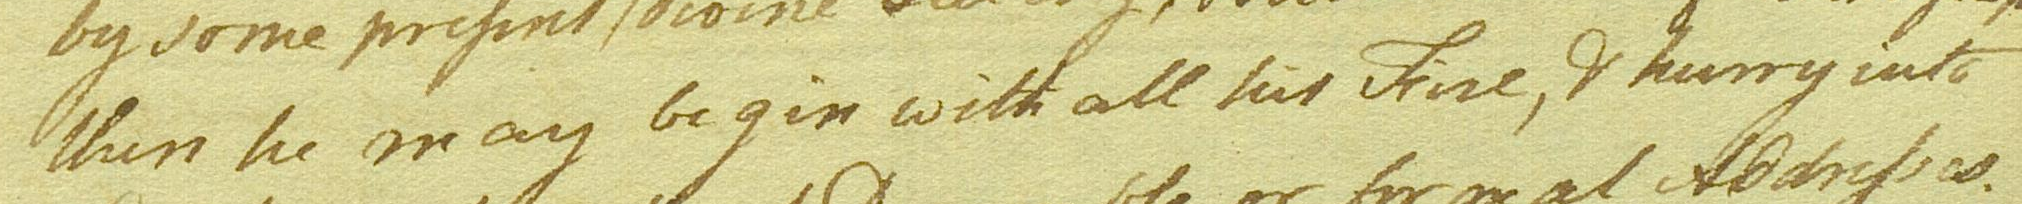then he may begin with all his Fire, & hurry into
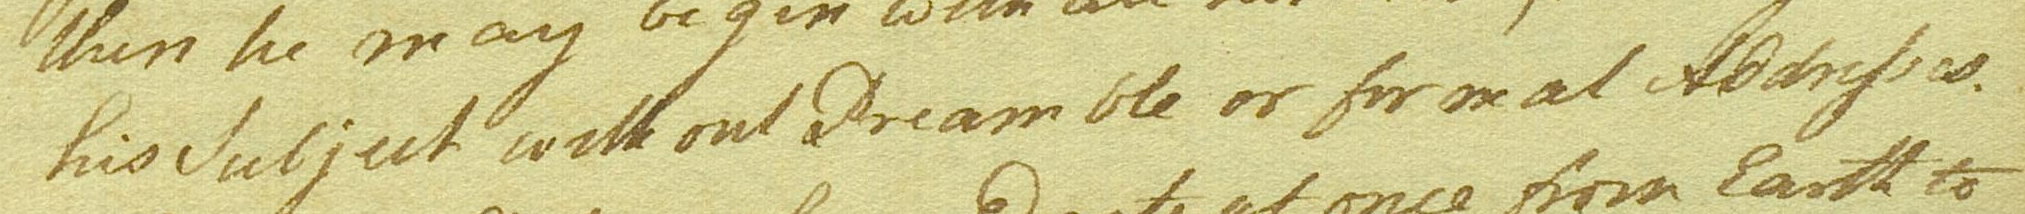his Subject without Preamble or formal Addresses.
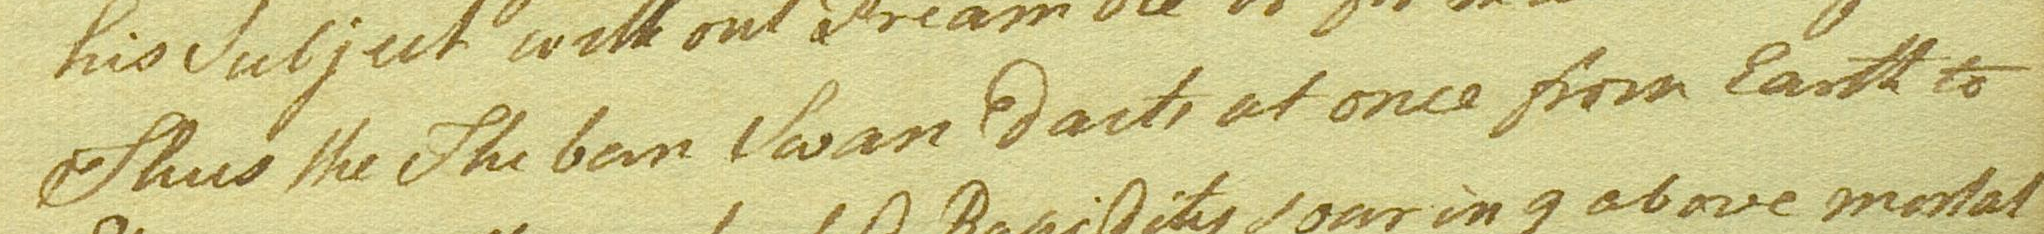Thus the Theban Swan darts at once from Earth to
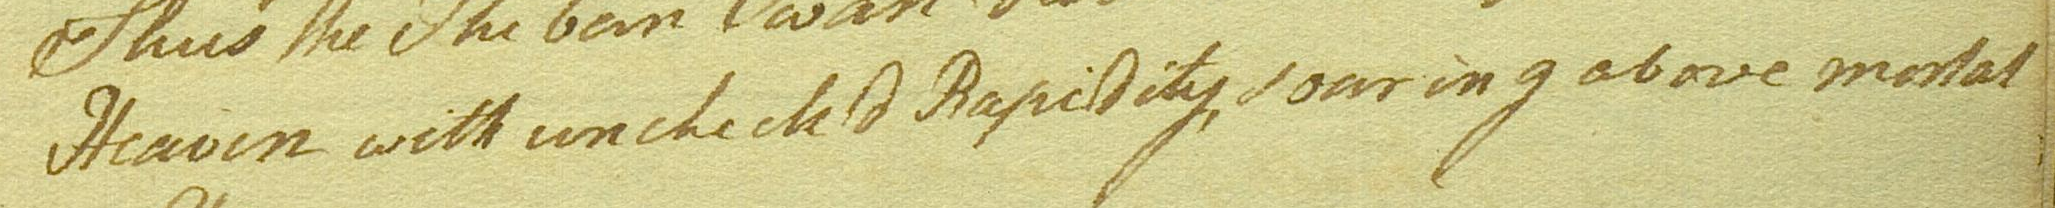Heaven with uncheck'd Rapidity soaring above mortal
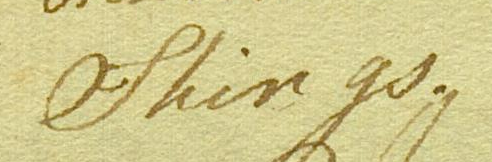Things.
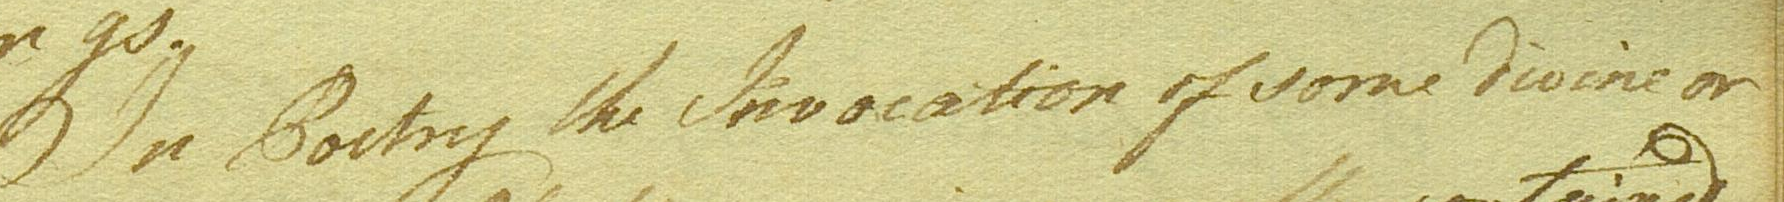In Poetry the Invocation of some divine or
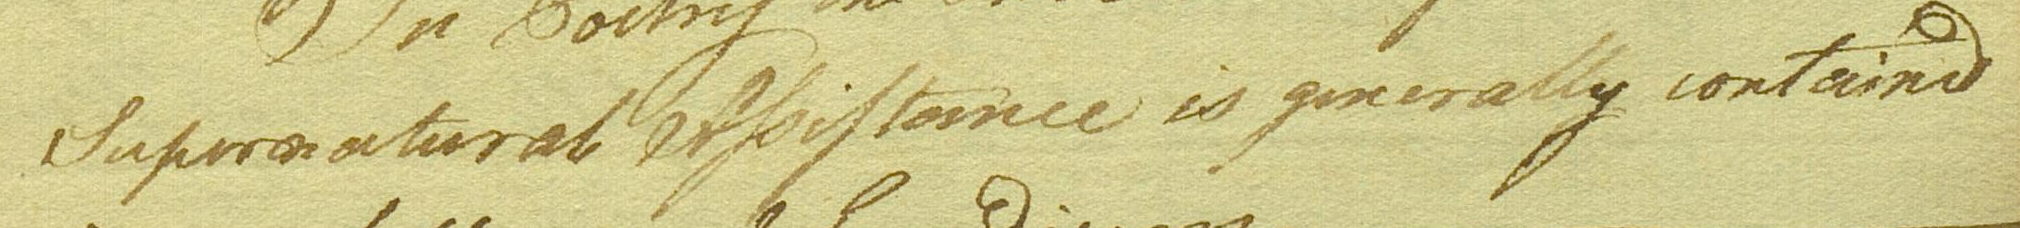Supernatural Assistance is generally contain'd
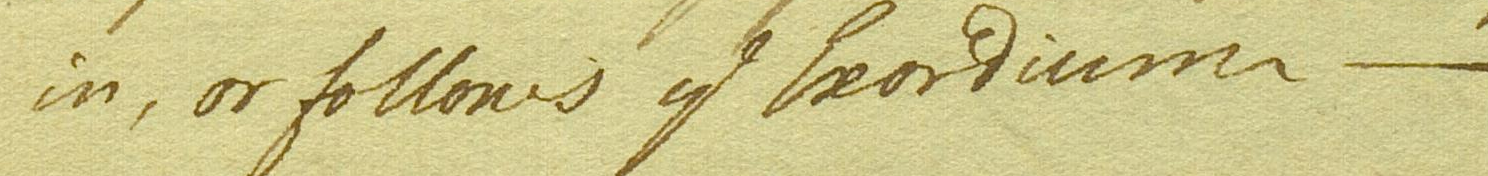in, or follows y^e Exordium-
